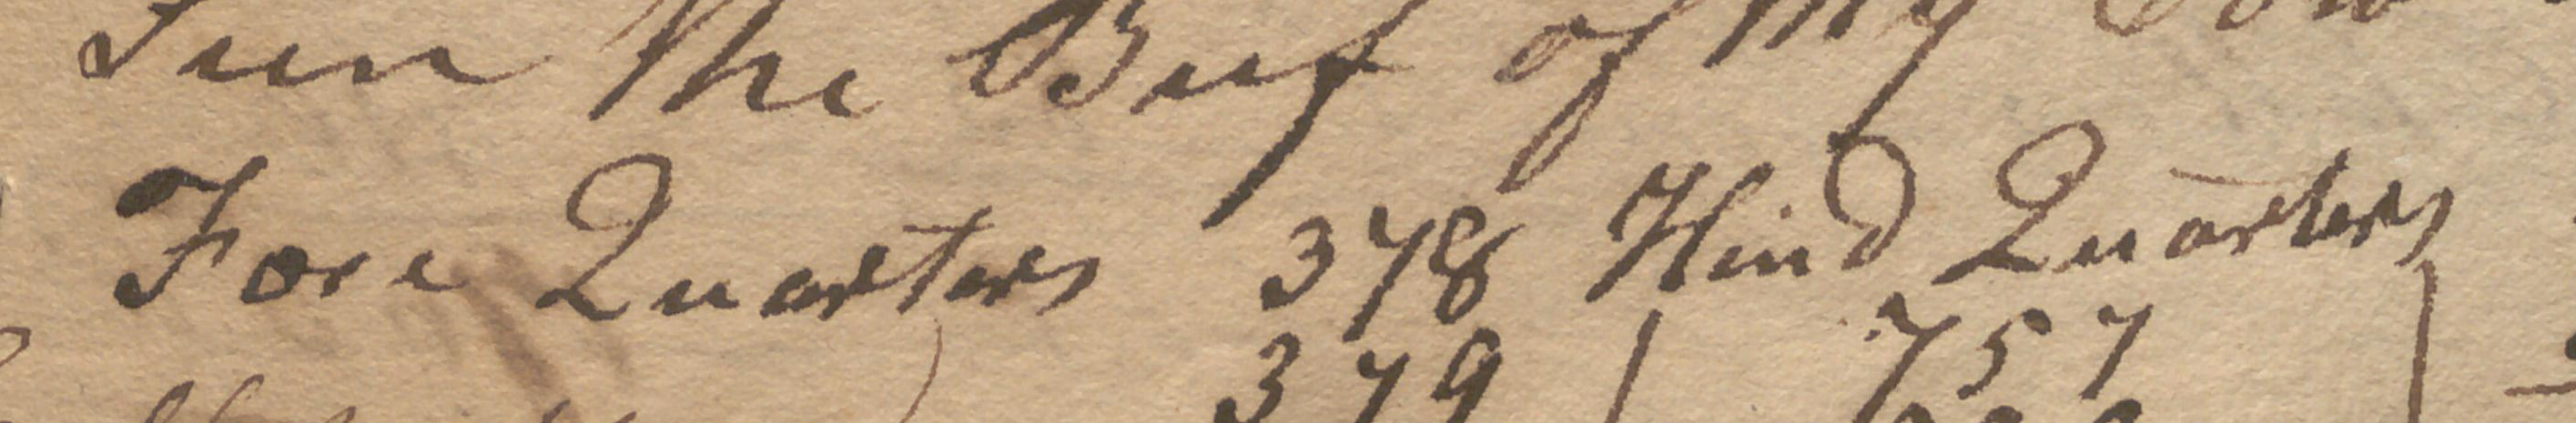Fore Quarters 378 Hind Quarters
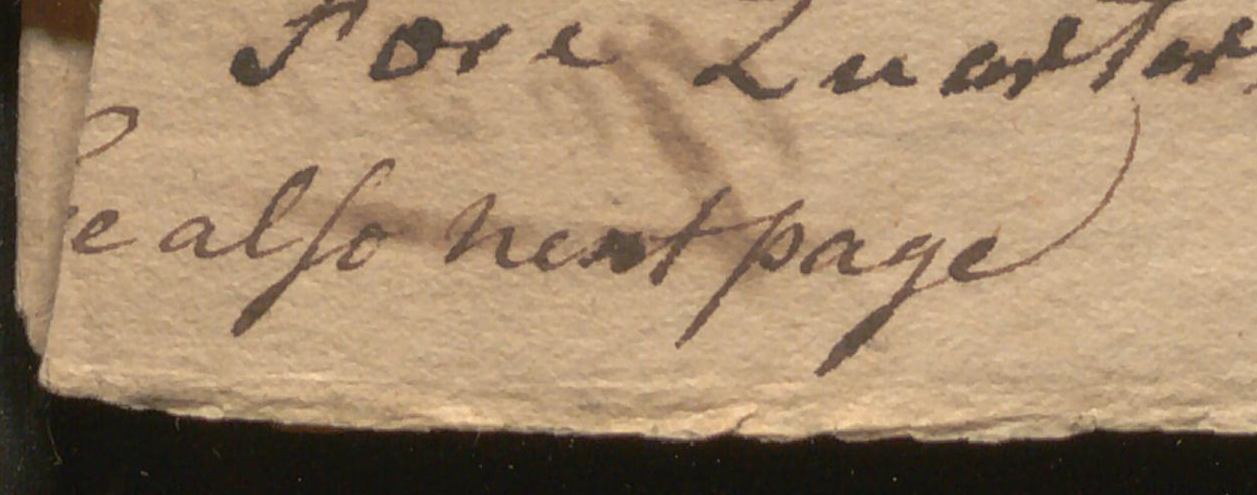e also next page
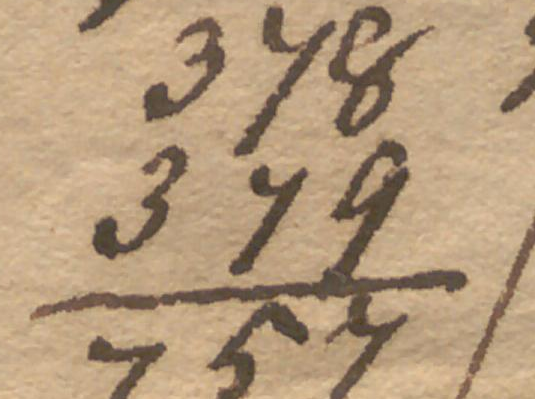379
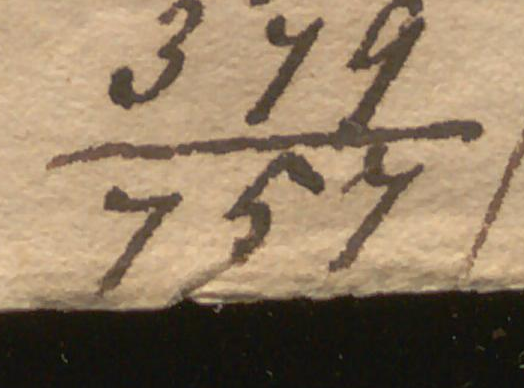787
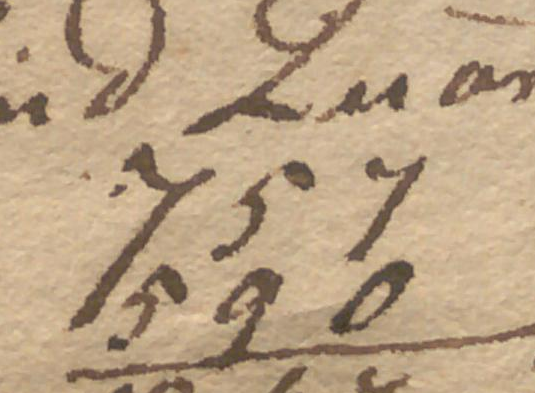757
